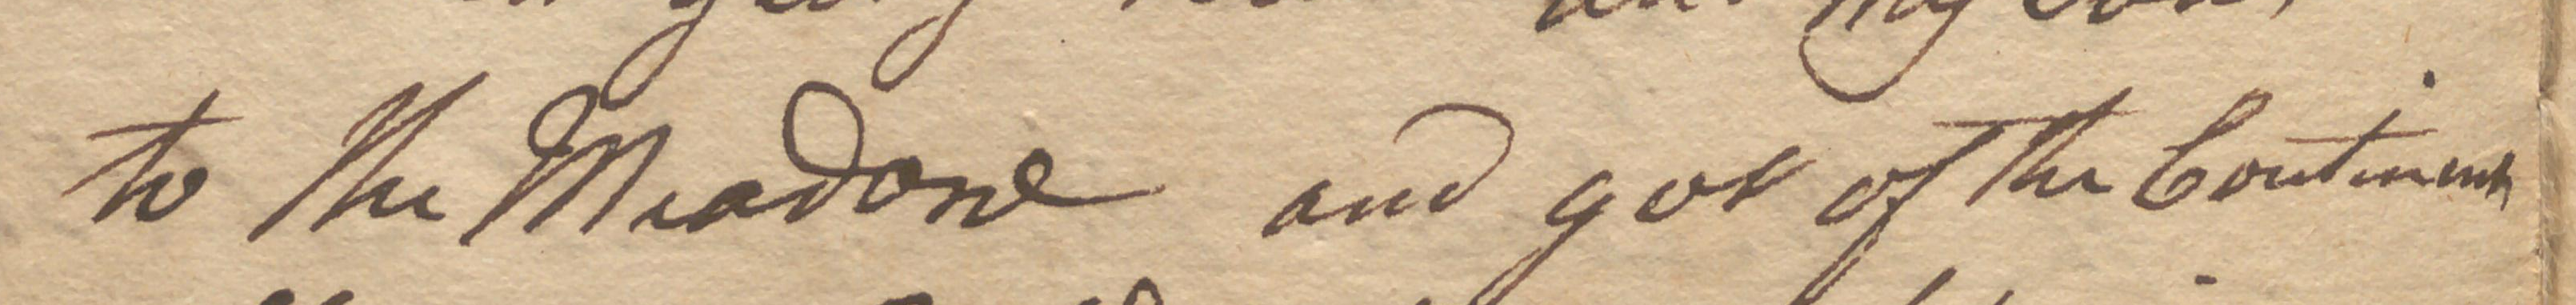to the Meadow and got of the Continent
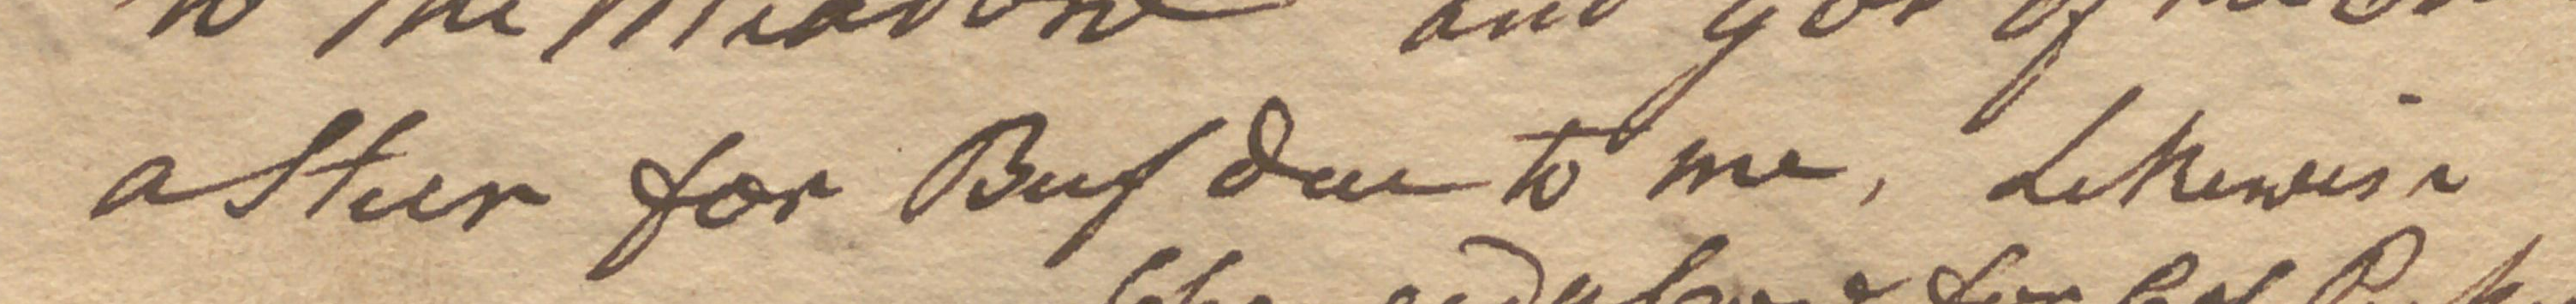a Steer for Beef due to me, Likewise
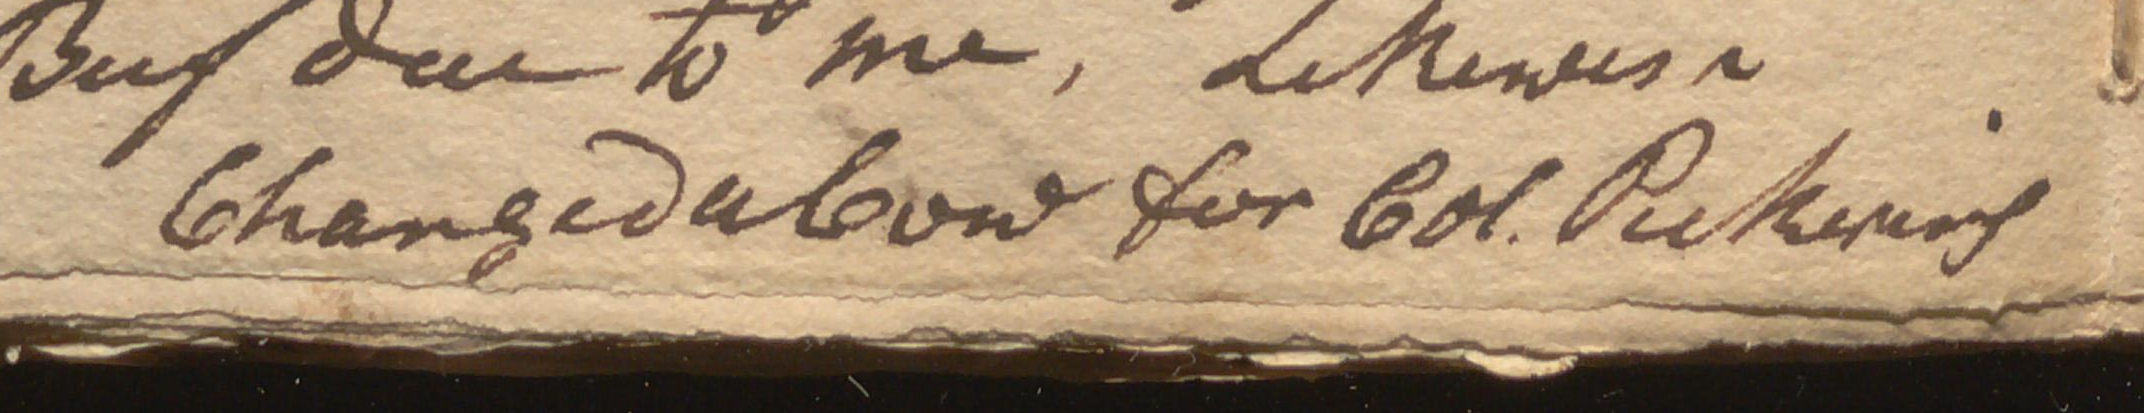Changed a Cow for Col Pickering
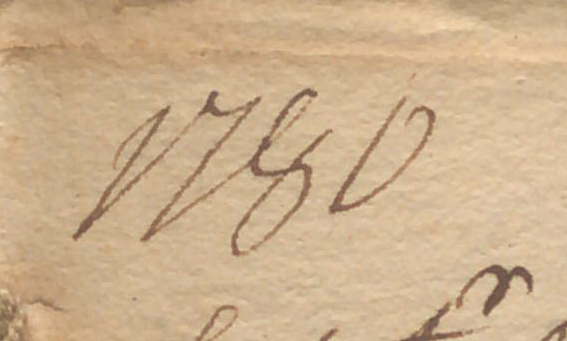1780
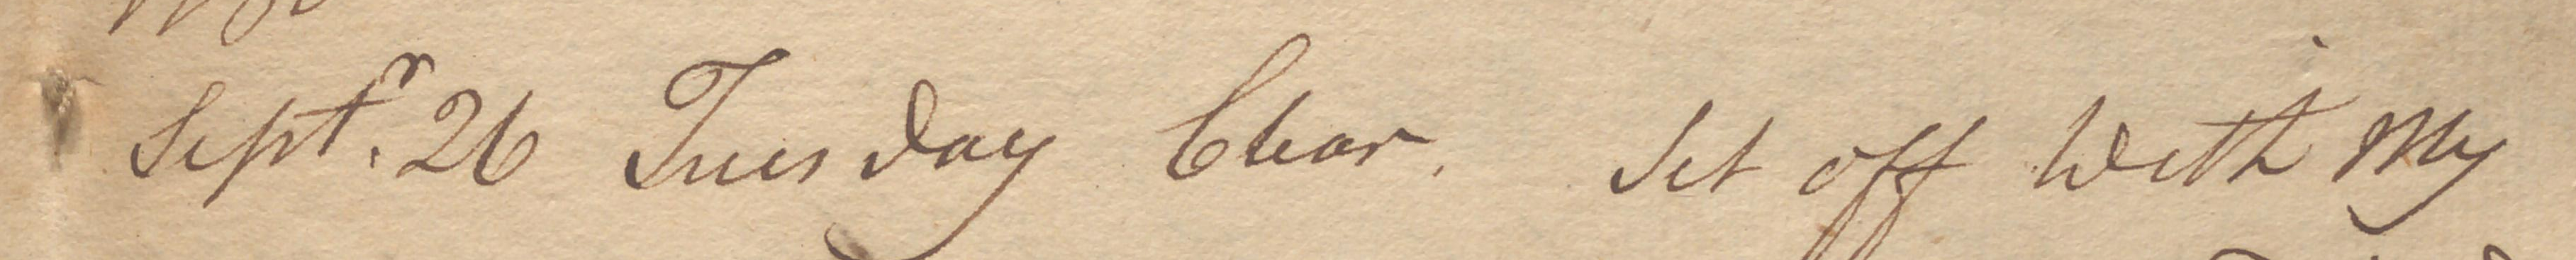Sept^r. 26 Tuesday Clear. Set off with My
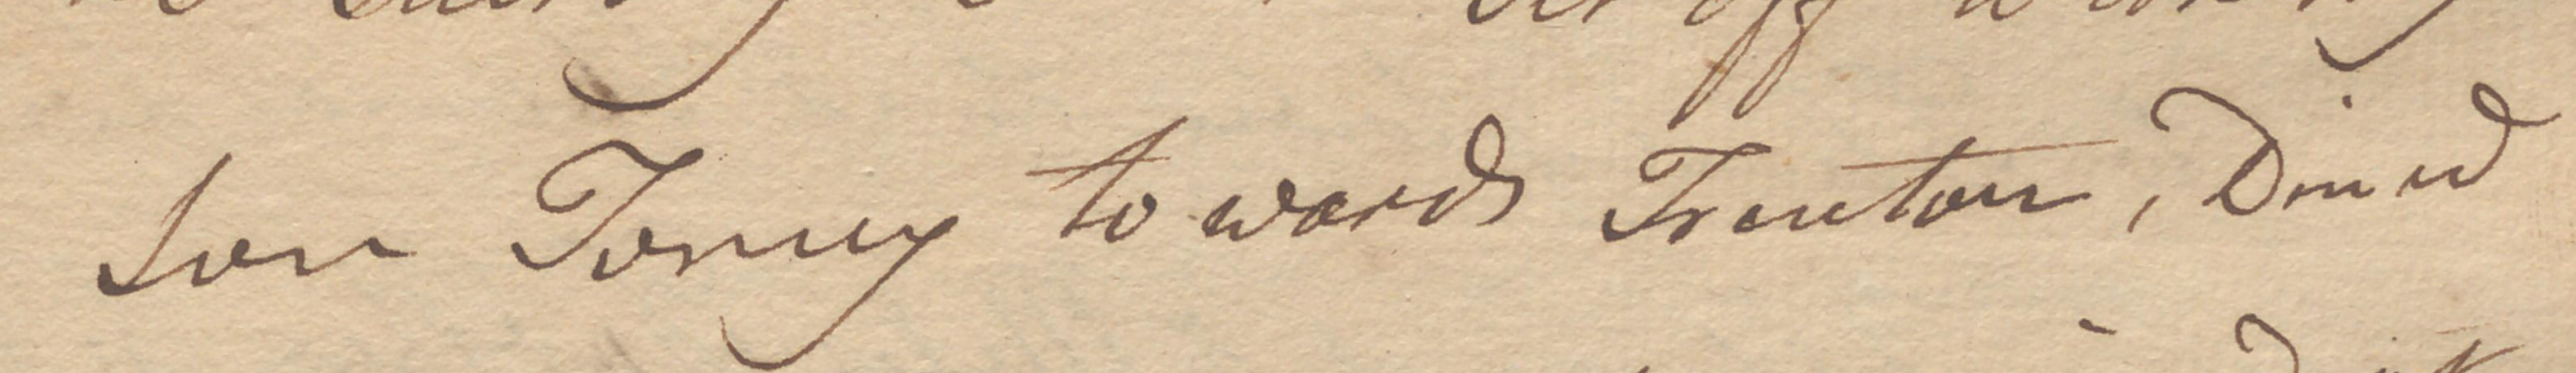son Toney to wards Trenton, Dined
